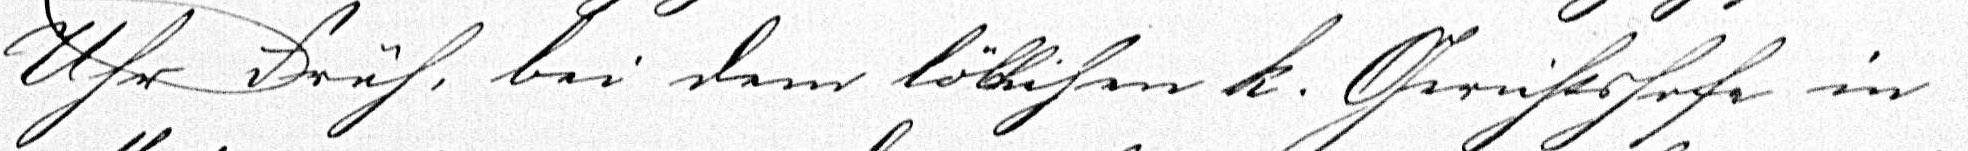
Uhr früh, bei dem löblichen k. Gerichtshofe in
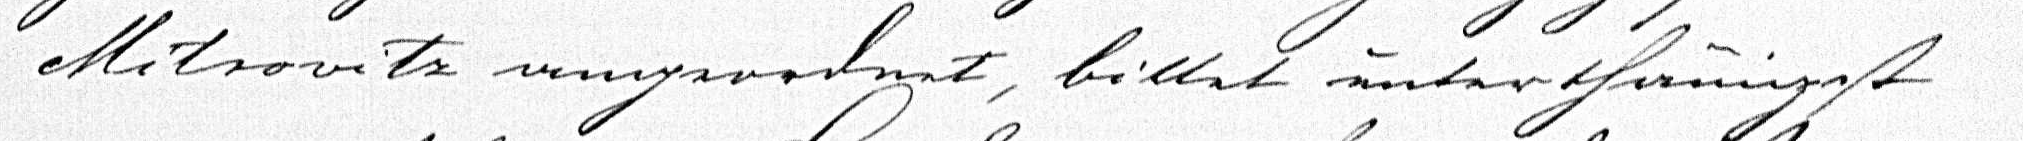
Mitrovitz angeordnet, bittet unterthänigst
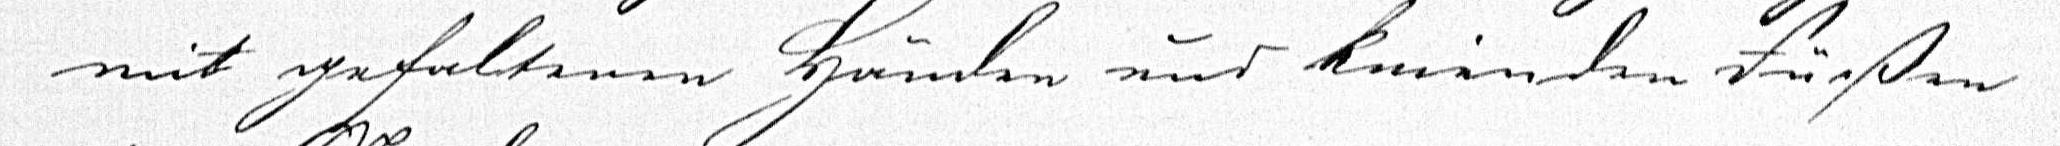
mit gefaltenen Händen und knienden Füßen
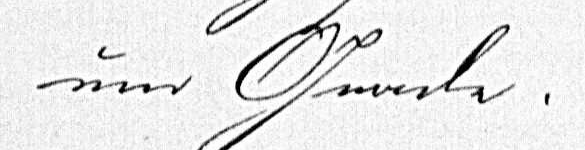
um Gnade.
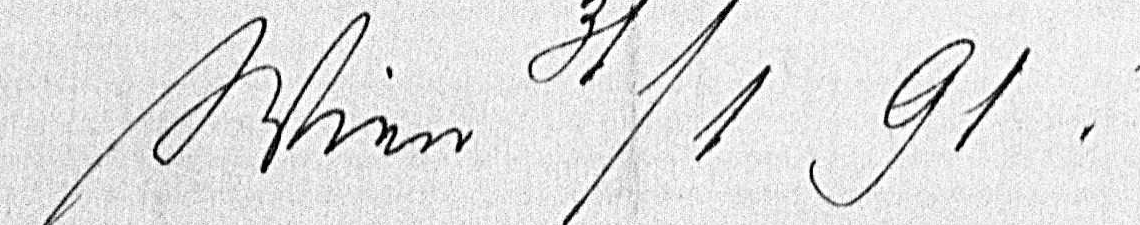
Wien 31/1 91
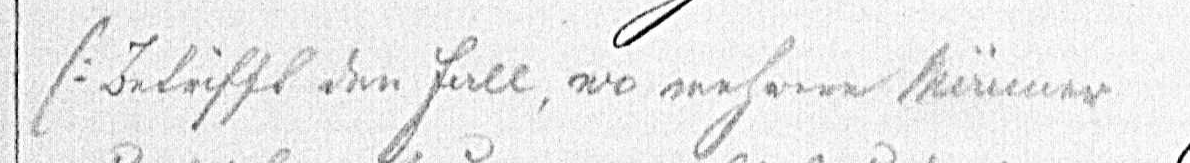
(Betrifft den Fall, wo mehrer Männer
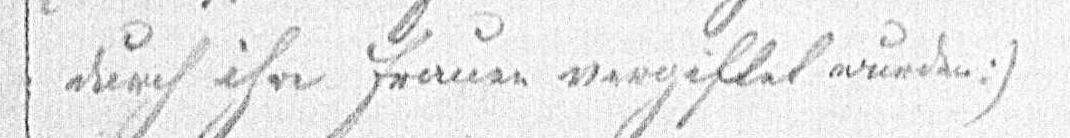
durch ihr Frauen vergiftet wurden)
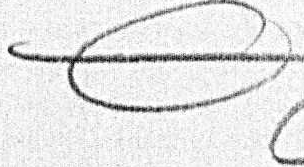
0
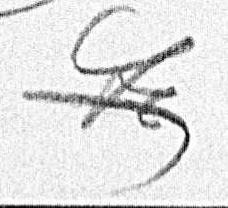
FJ
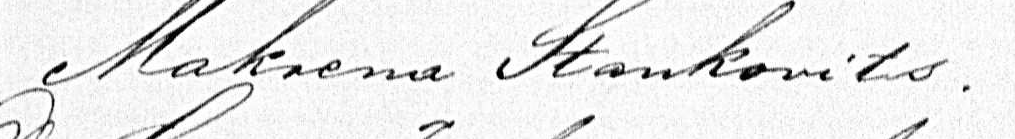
Makrena Stankovits
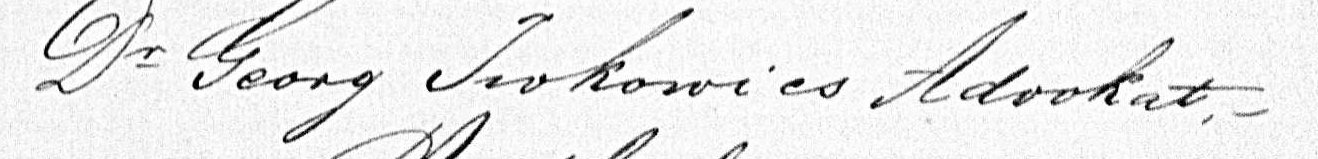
Dr. Georg Iwkowics Advokat
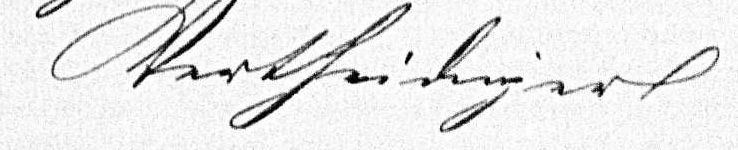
Vertheidiger
